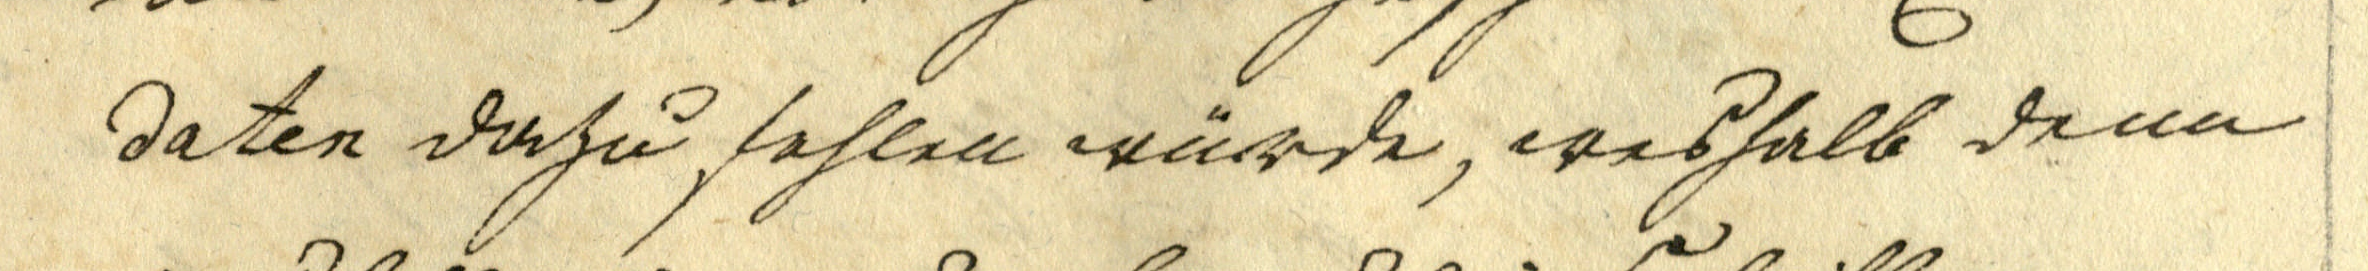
daten dazu fehlen würde, weshalb denn
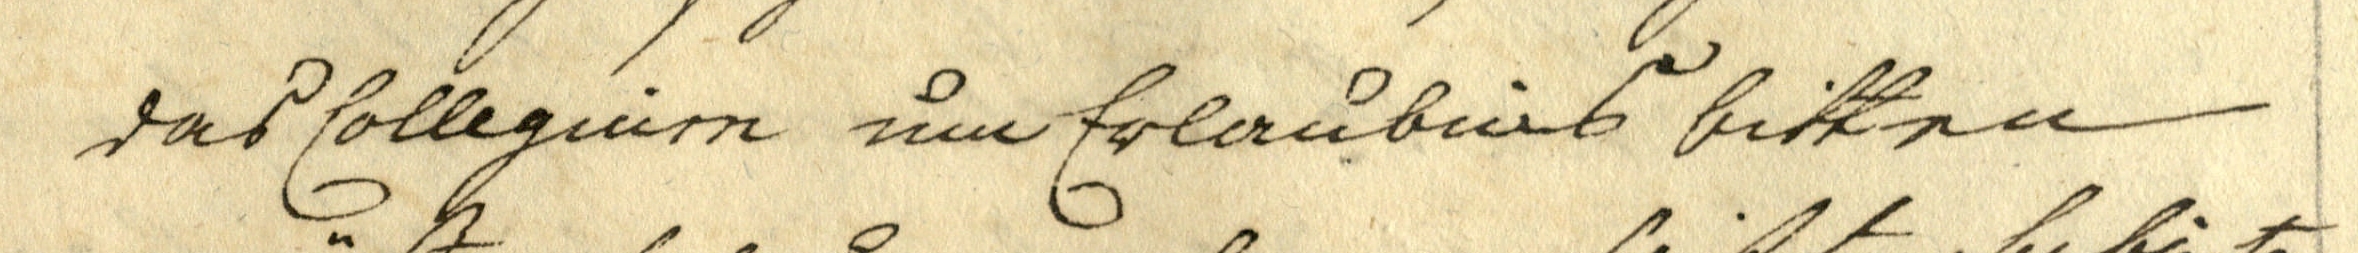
das Collegium um Erlaubnis bitten
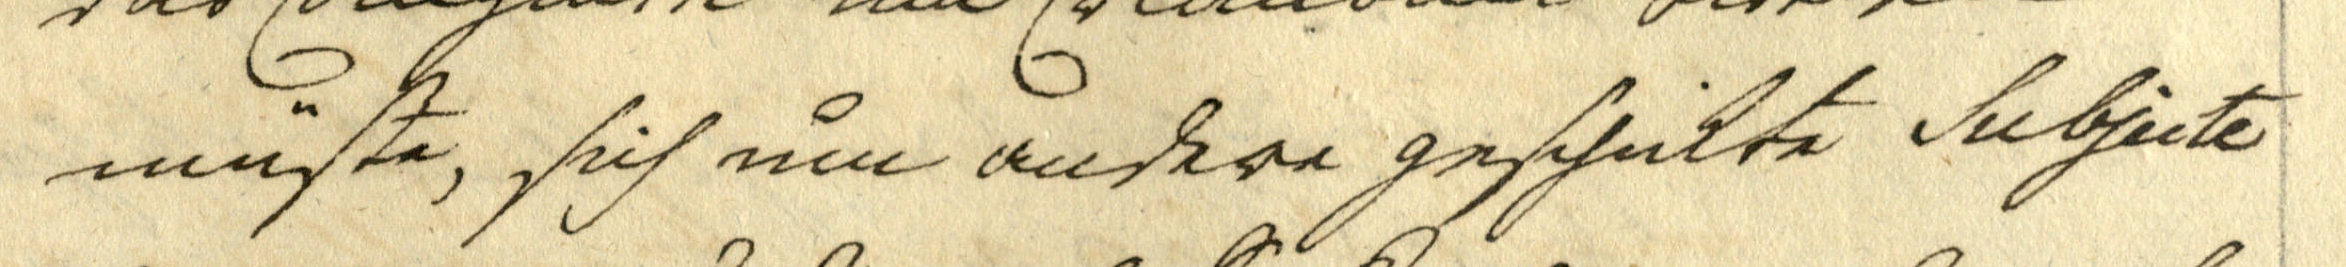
müßte, sich um andere geschickte Subjecte
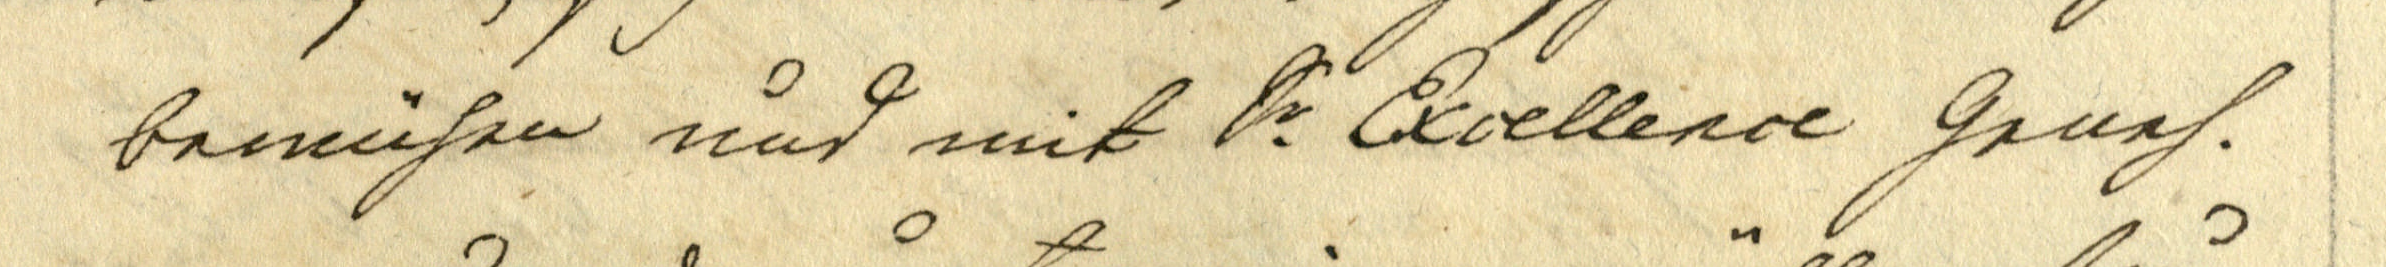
bemühen und mit Sr Excellence Geneh¬
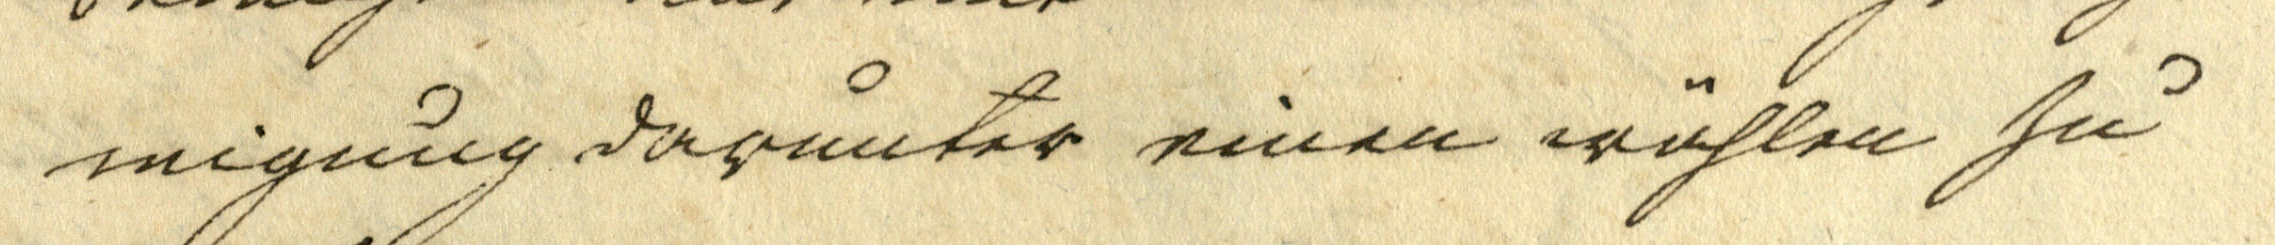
migung darunter einen wählen zu
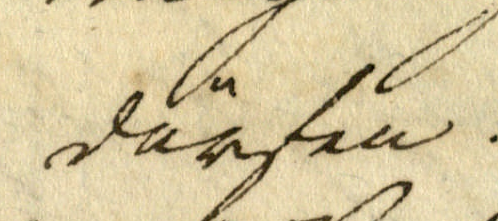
dürfen.
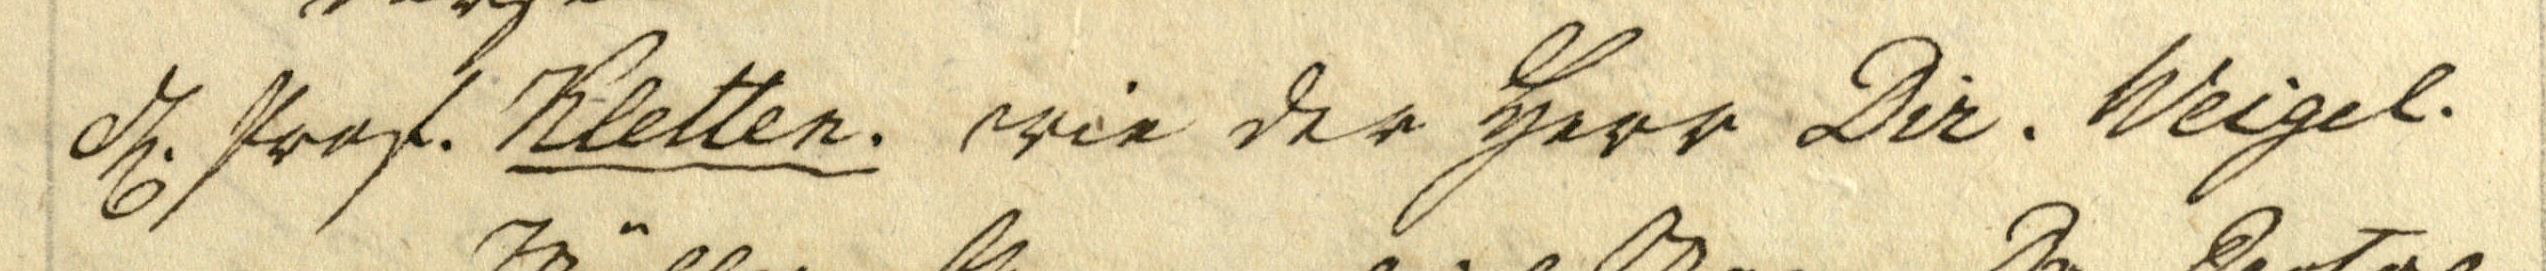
dh. Prof. Kletten. wie der Herr Dir. Weigel.
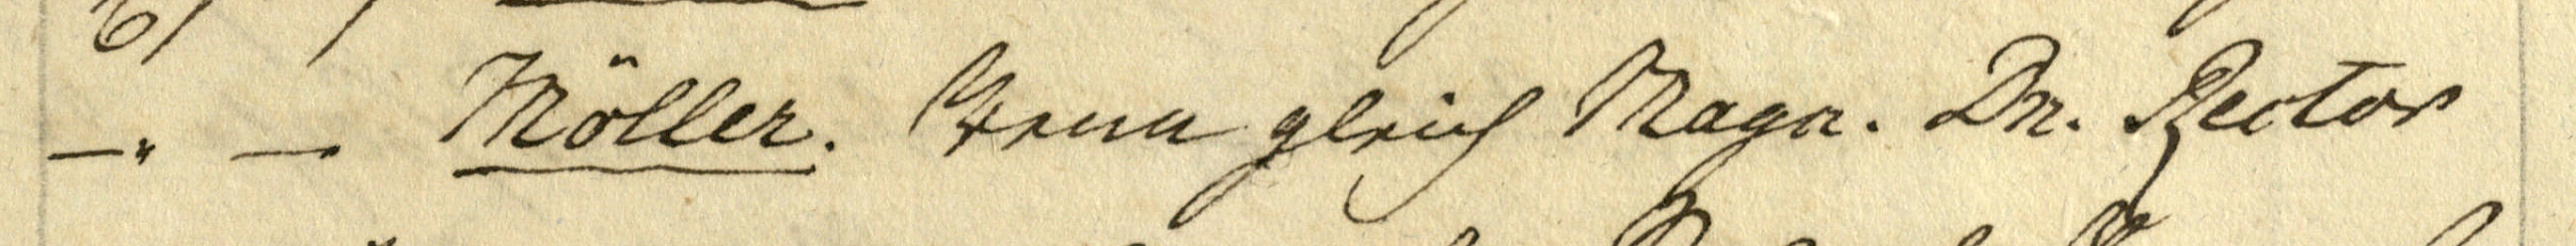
Möller. Wenn gleich Magn. Dn. Rector
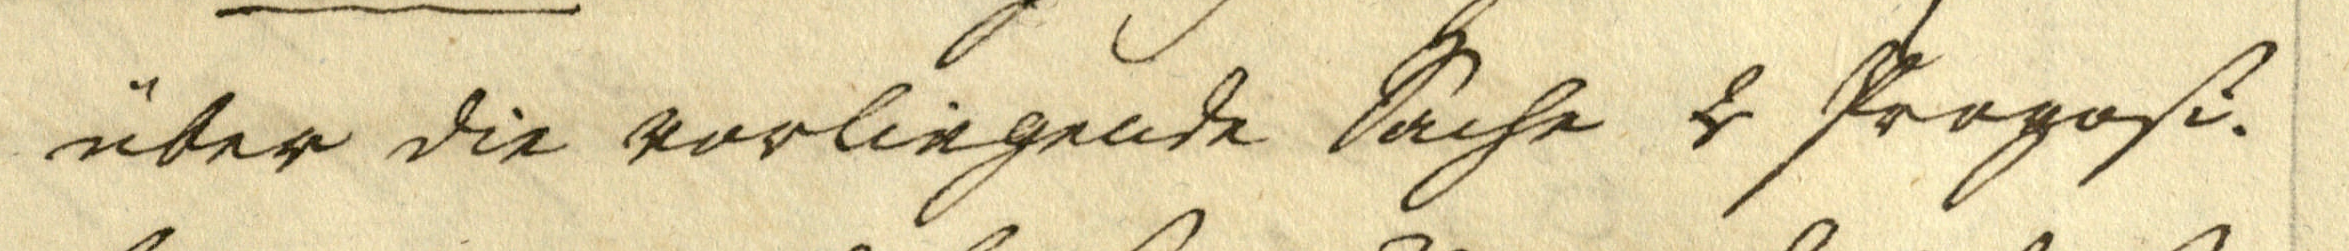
über die vorliegende Sache 2 Proposi¬
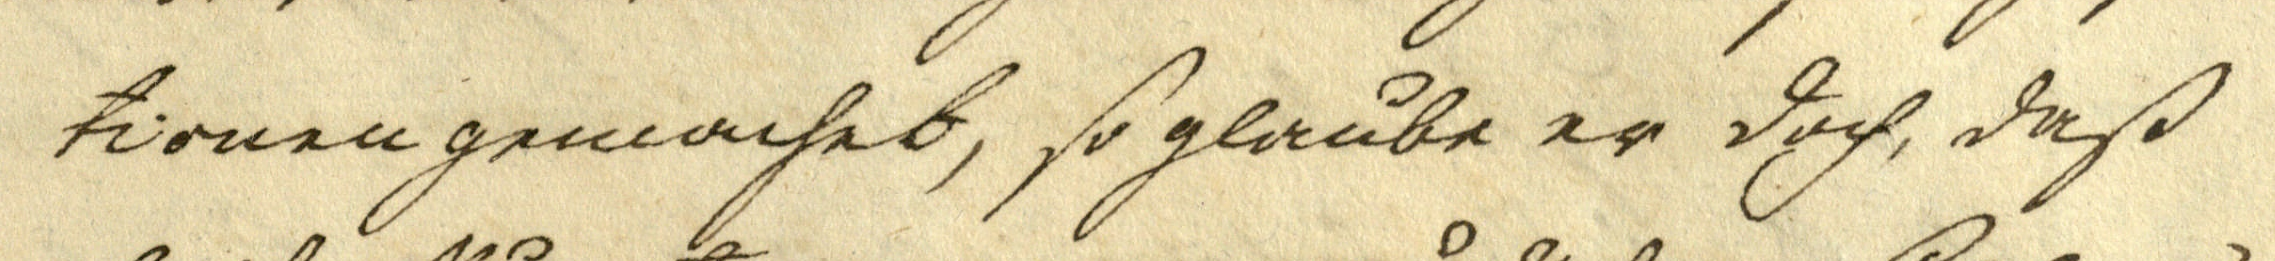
tionen gemachet, so glaube er doch, daß
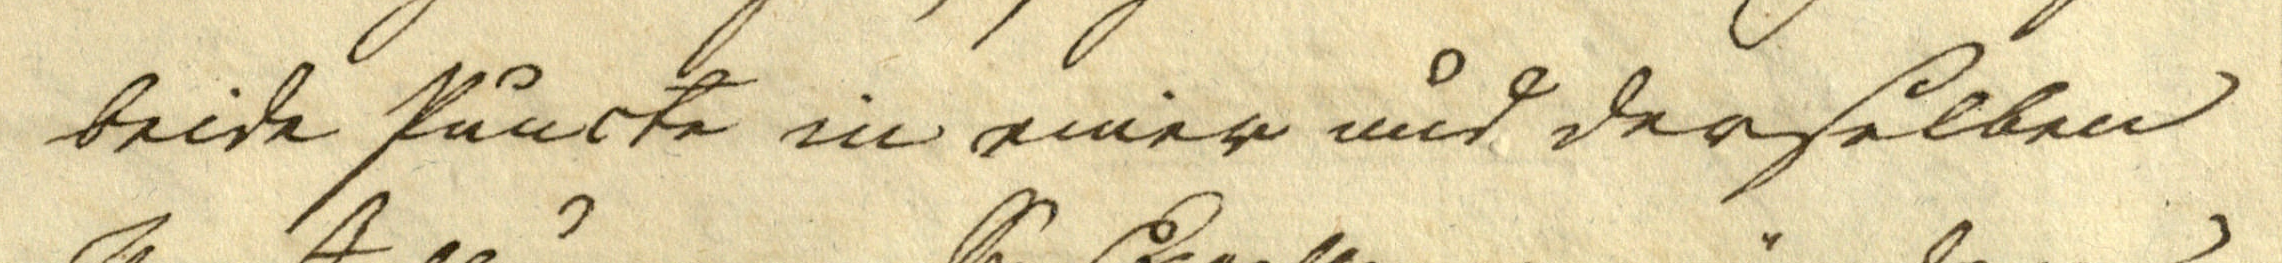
beide Puncte in einer und derselben
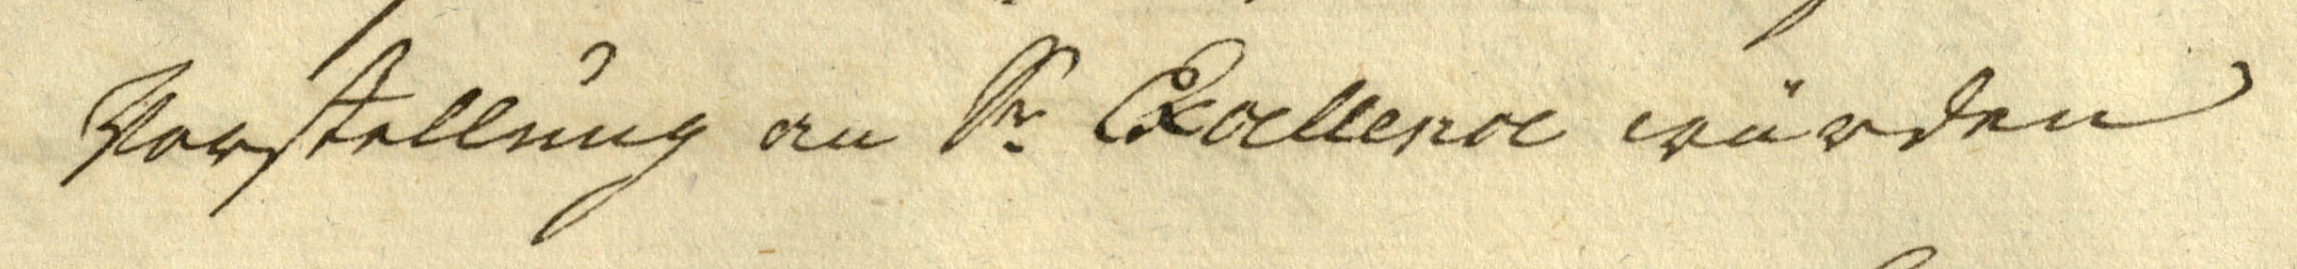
Vorstellung an Sr Excellence würden
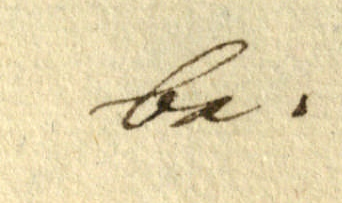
be.
